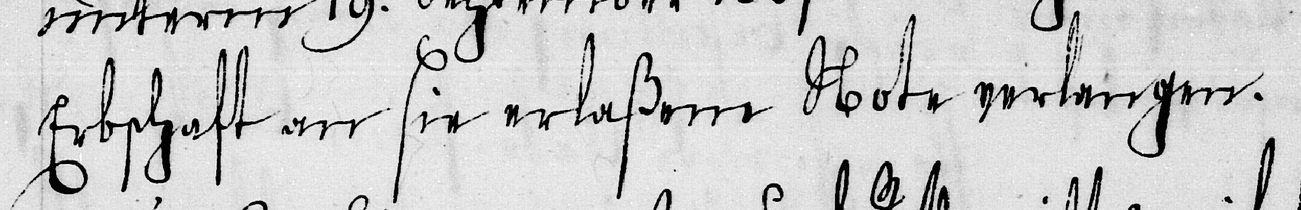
Erbschaft an sie erlaßene Note verlangen.
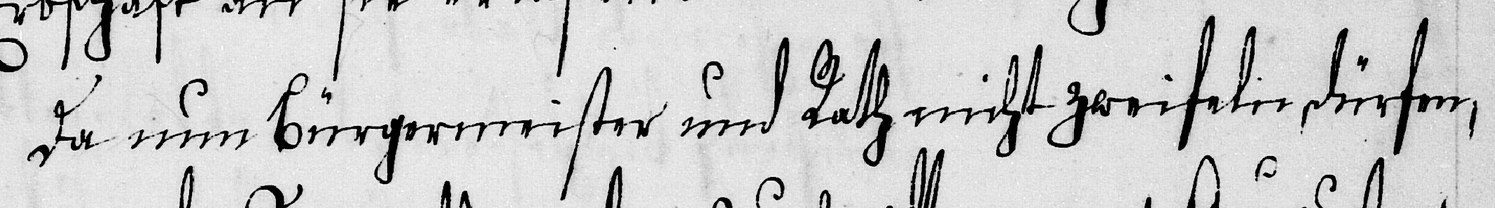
Da nun Bürgermeister und Rath nicht zweifeln dürfen,
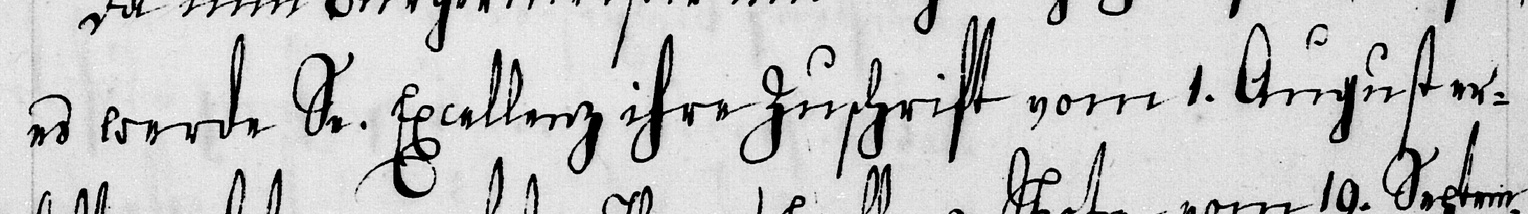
es werde Sn. Excellenz ihre Zuschrift vom 1. August er¬
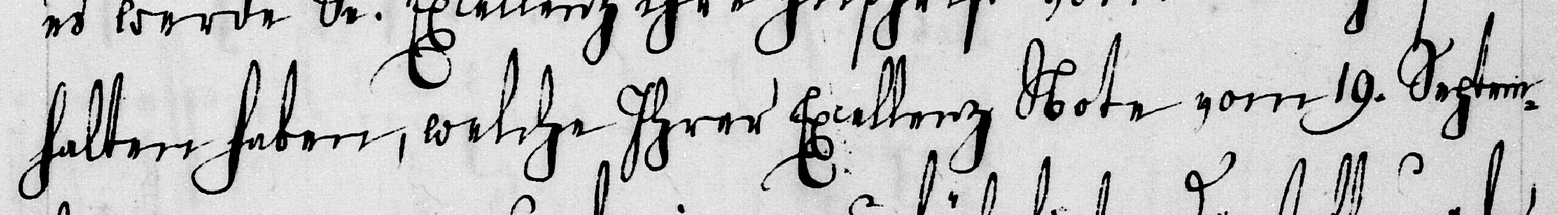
halten haben, welche Ihrer Excellenz Note vom 19. Septem¬
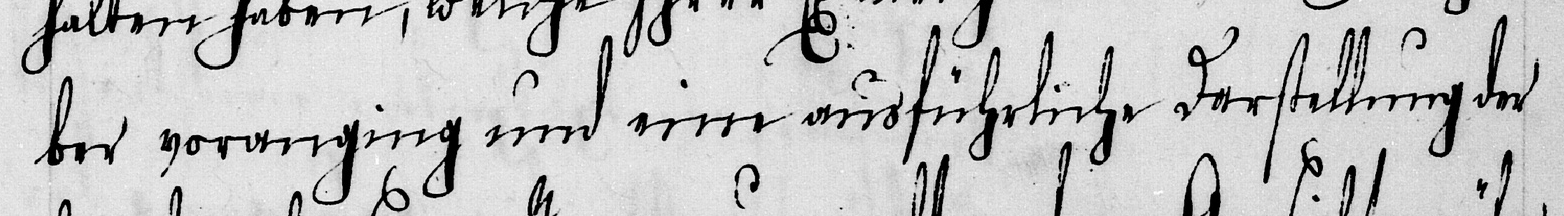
ber vorangig und eine ausführliche Darstellung der
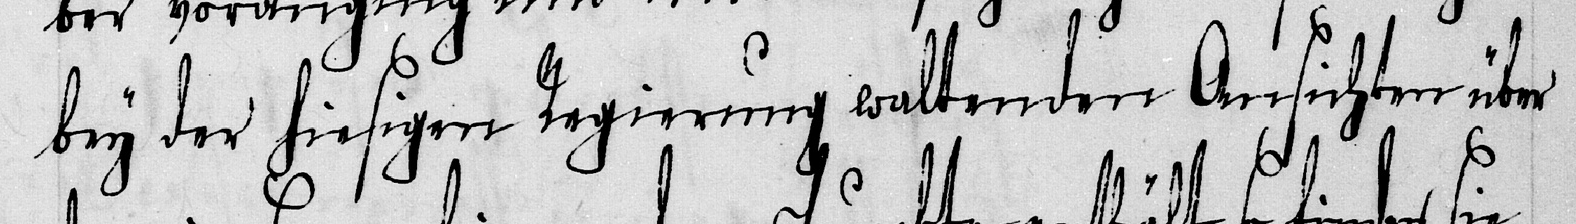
bey der hiesigen Regierung waltenden Ansichten über
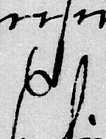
letz¬
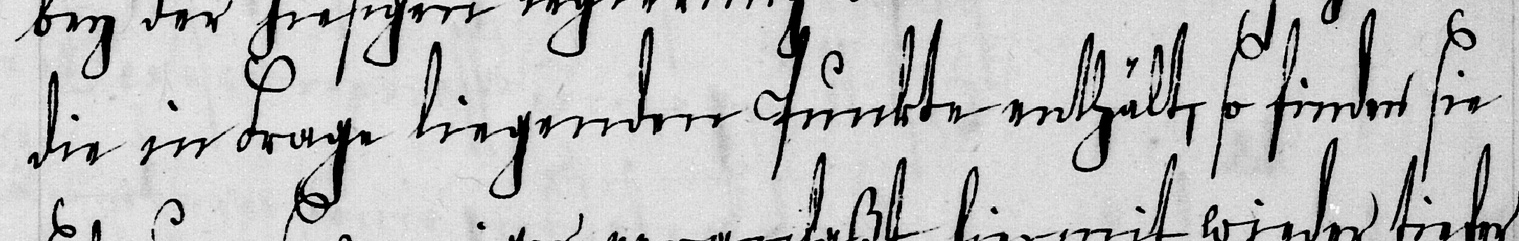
die in Frage liegenden Punkte enthält, so finden sie
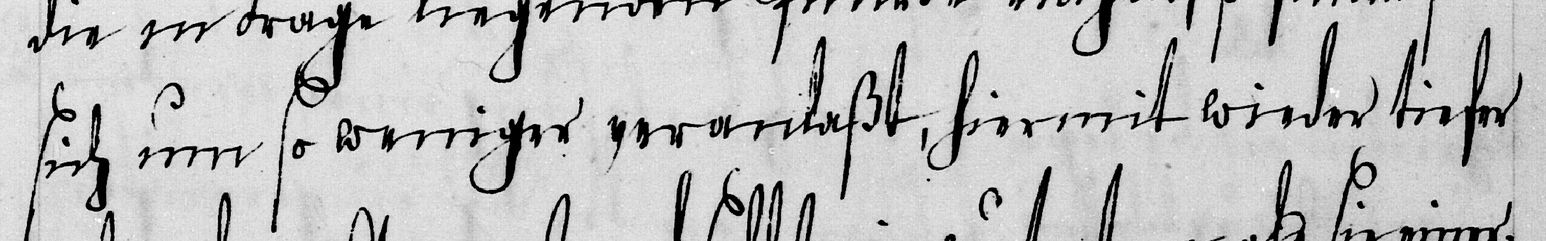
sich um so weniger veranlaßt, hiermit wieder tiefer
